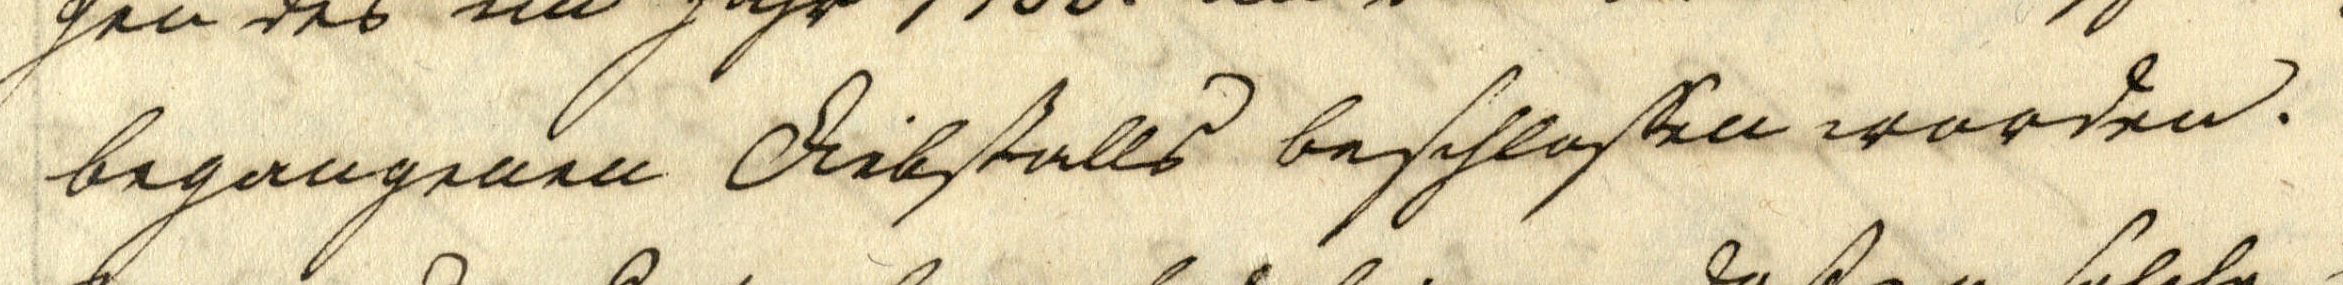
begangenen Diebstalls beschlossen worden.
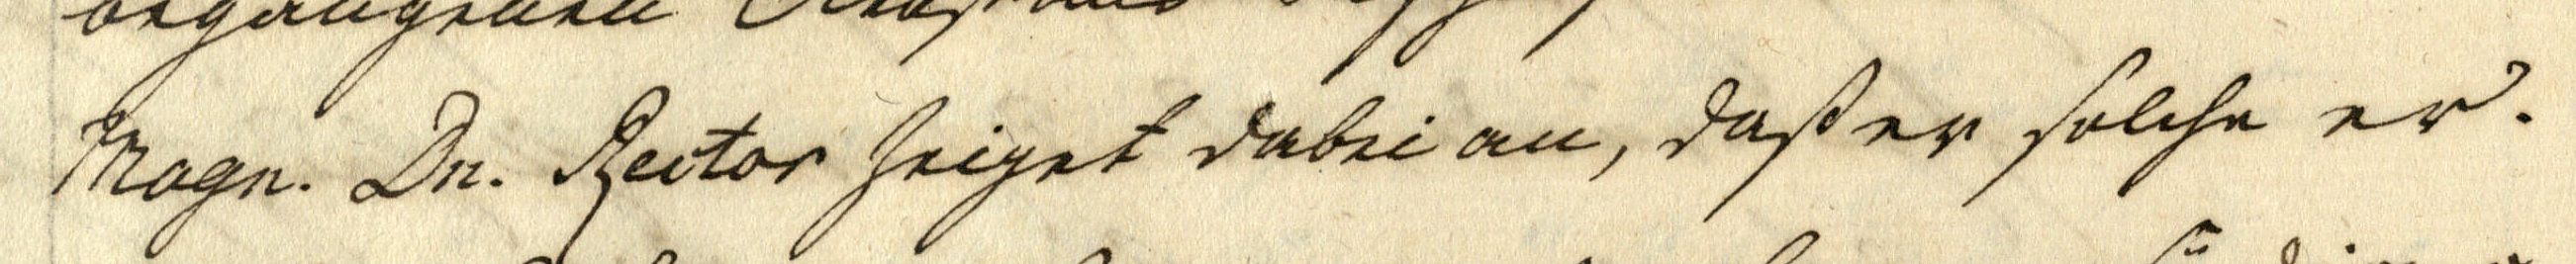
Magn. Dn. Rector zeiget dabei an, daß er solche er-
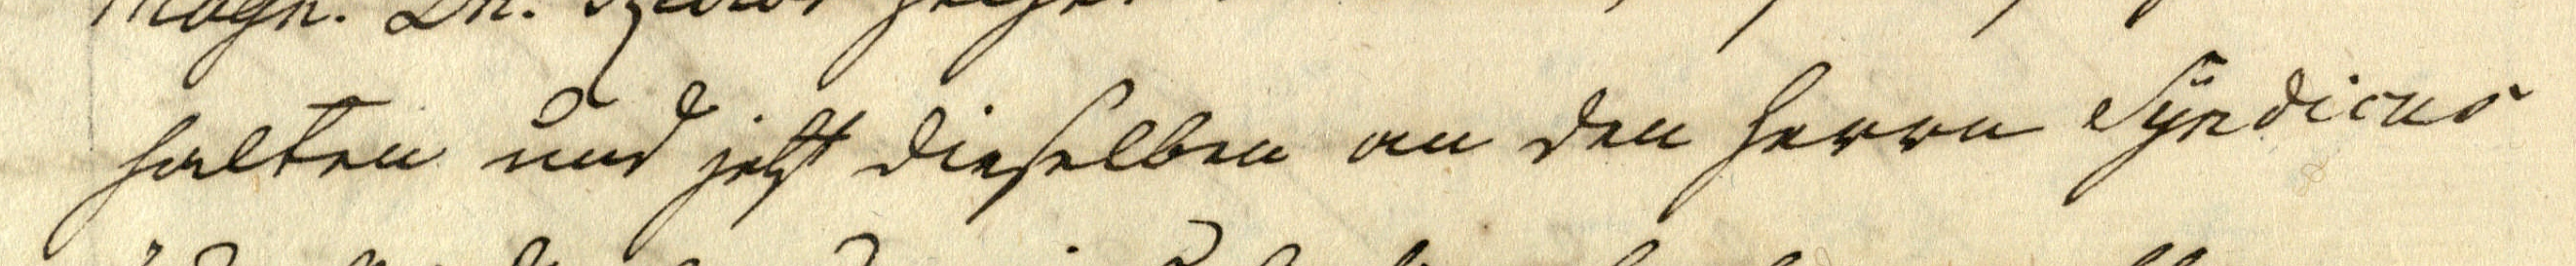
halten und jetzt dieselben an den herrn Syndicus
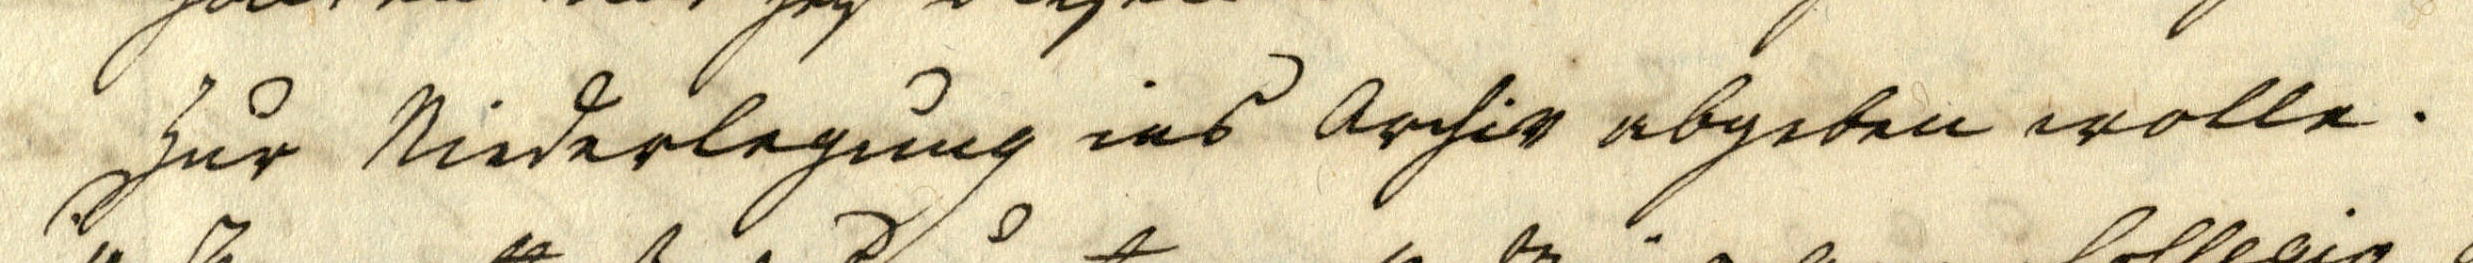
zur Niederlegung ins Archiv abgeben wolle.
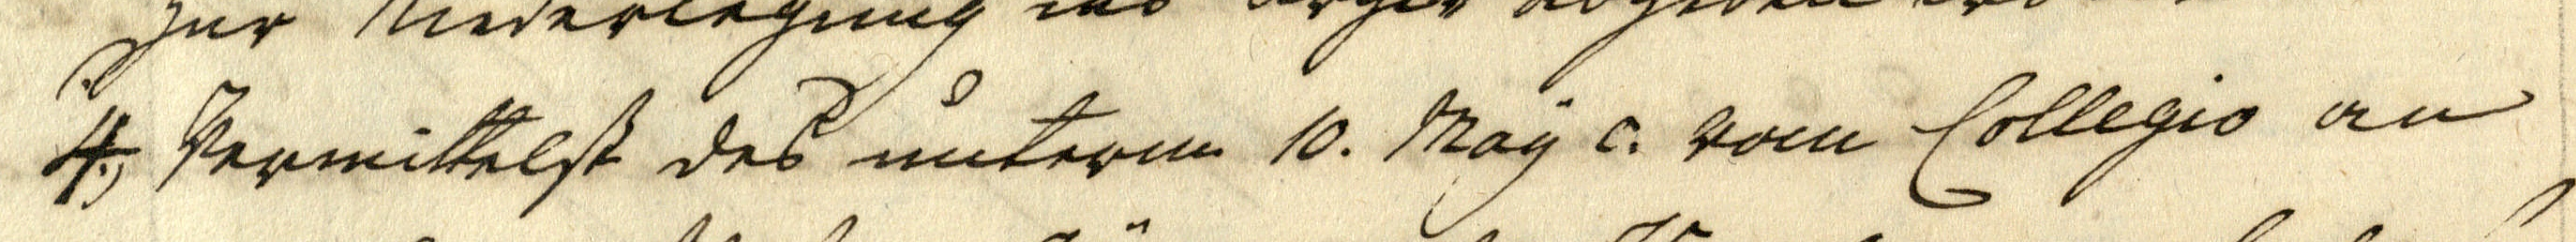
4., Vermittelst des unterm 10. May c. vom Collegio an
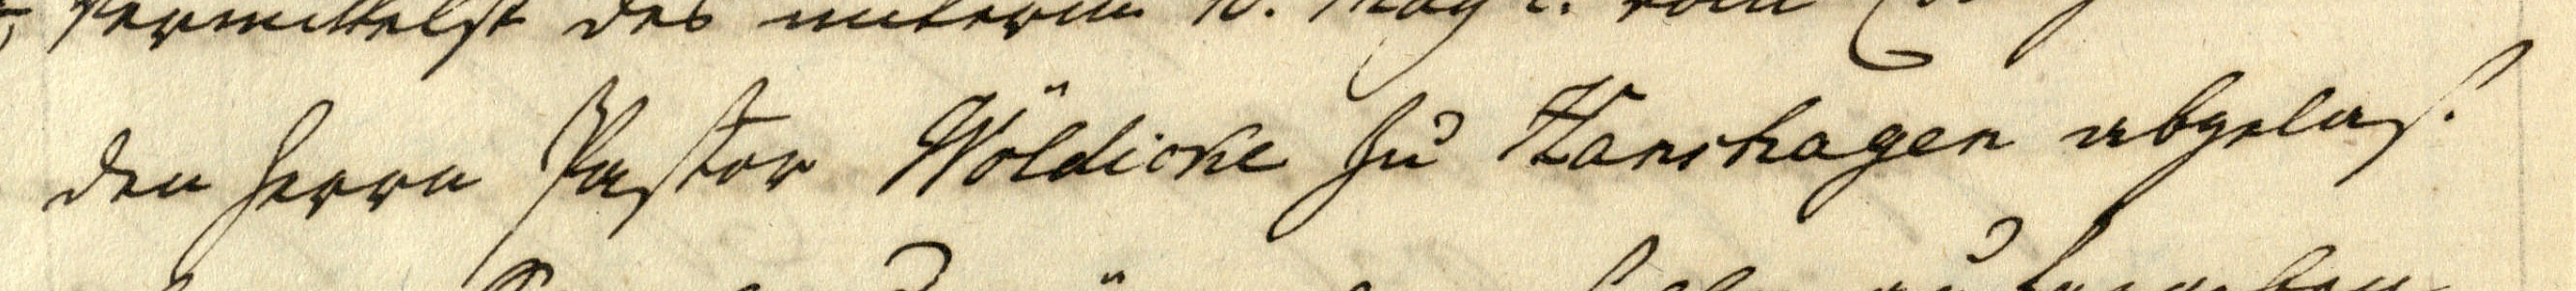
den Herrn Pastor Wöldicke zu Hanshagen abgelas-
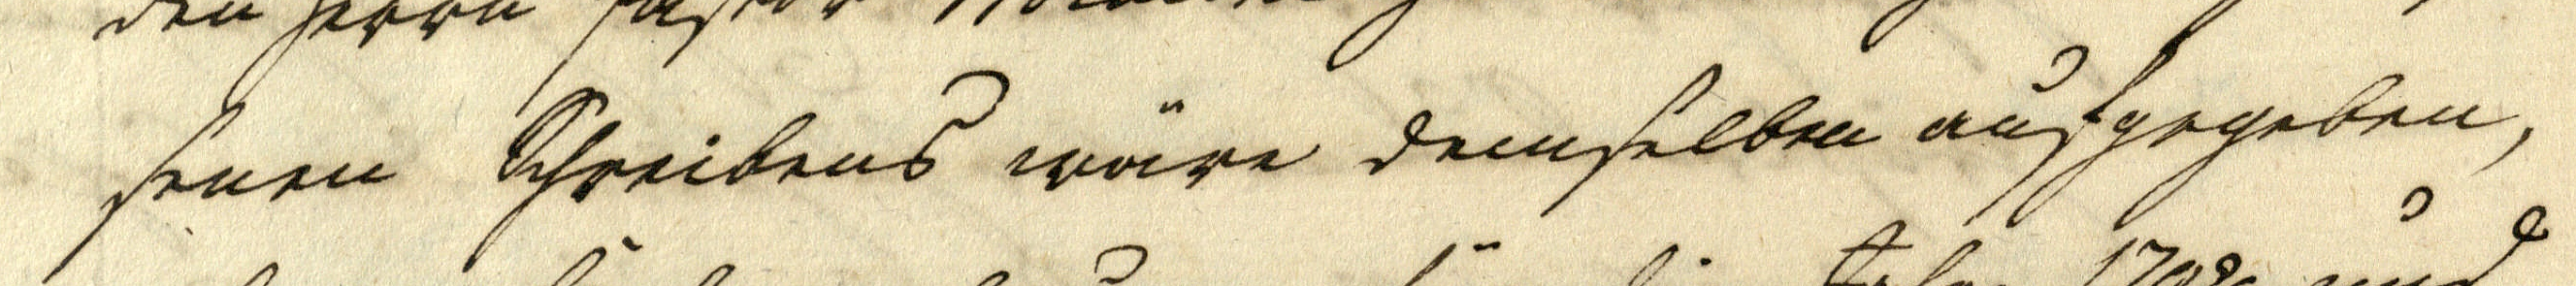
senen Schreibens wäre demselben aufgegeben,
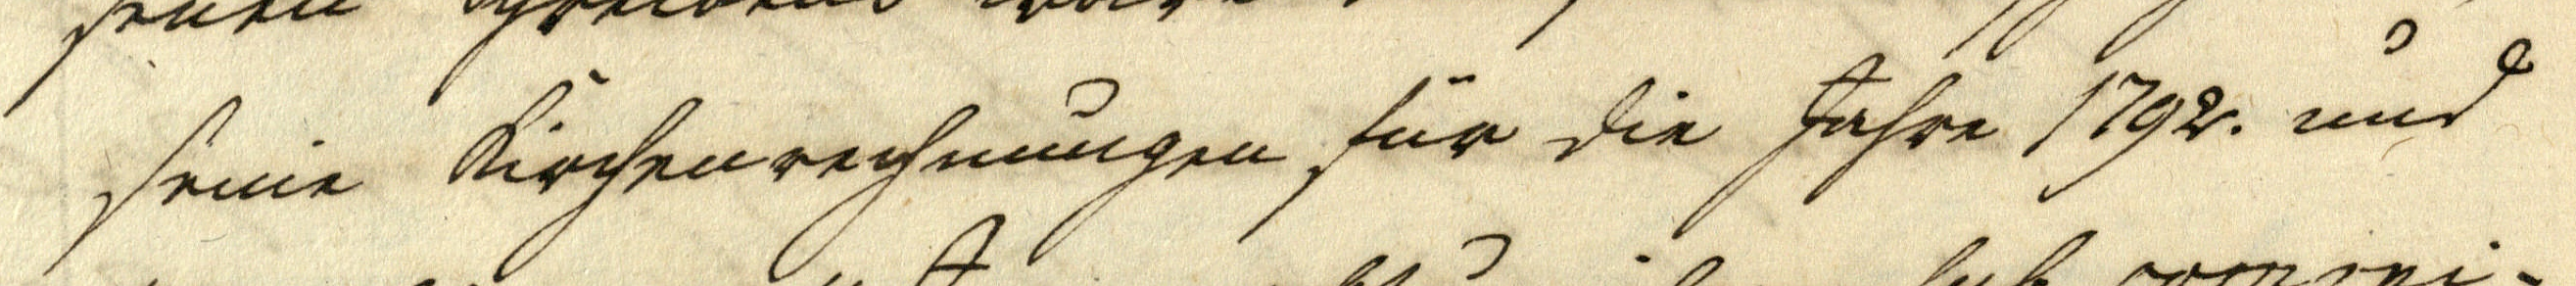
seine Kirchenrechnungen für die Jahre 1792. und
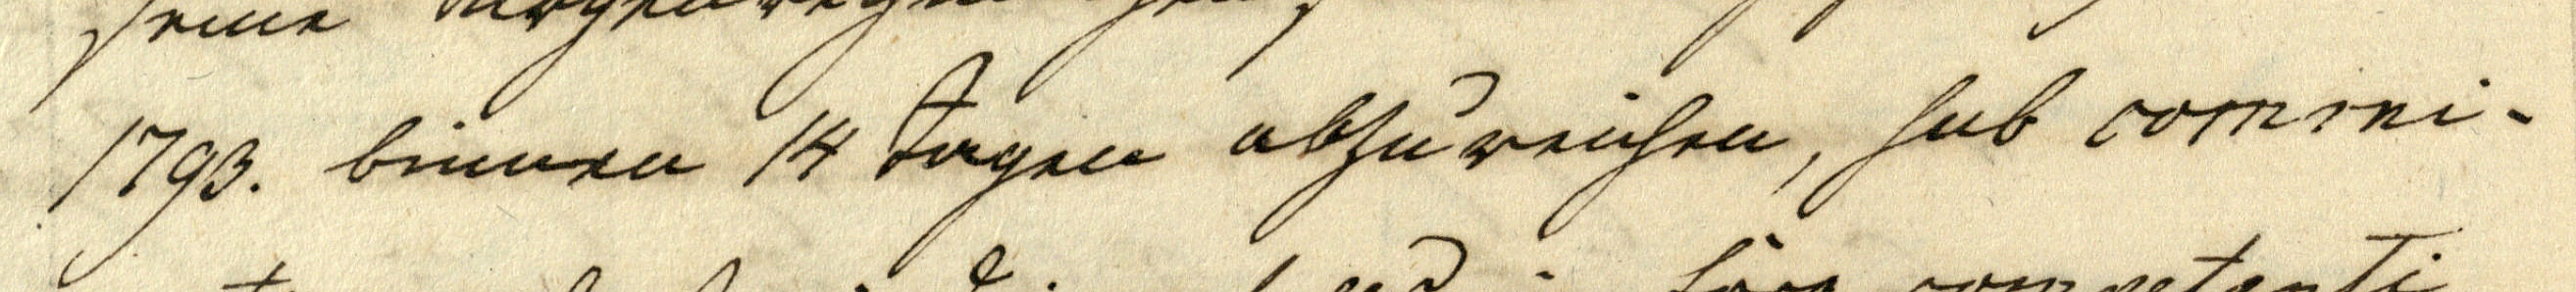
1793. binnen 14 Tagen abzureichen, sub commi-
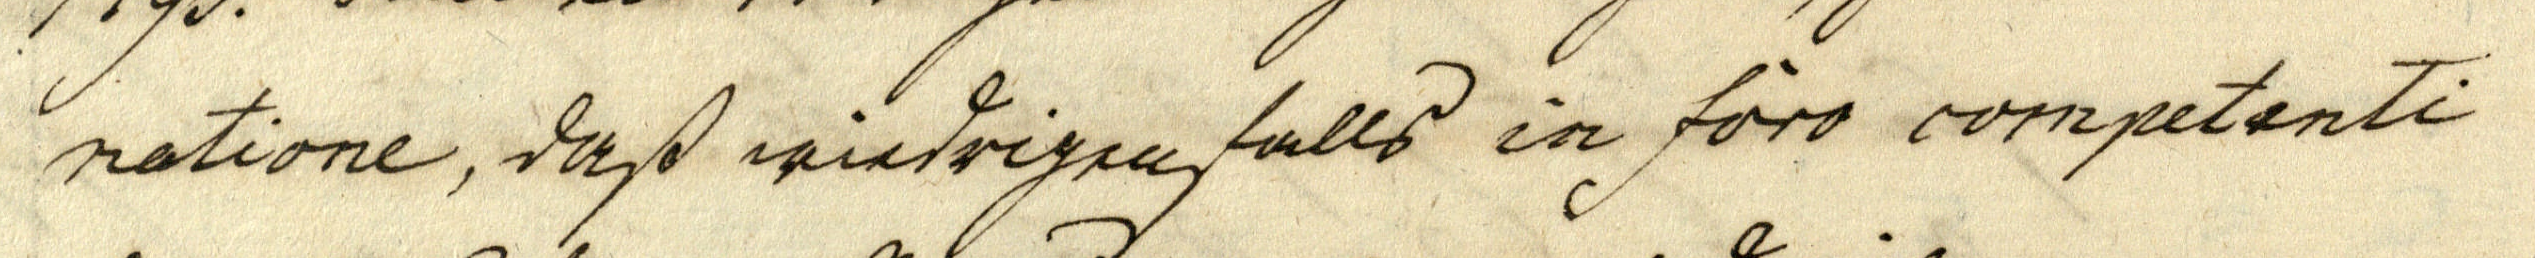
natione, daß wiedrigenfalls in foro competenti
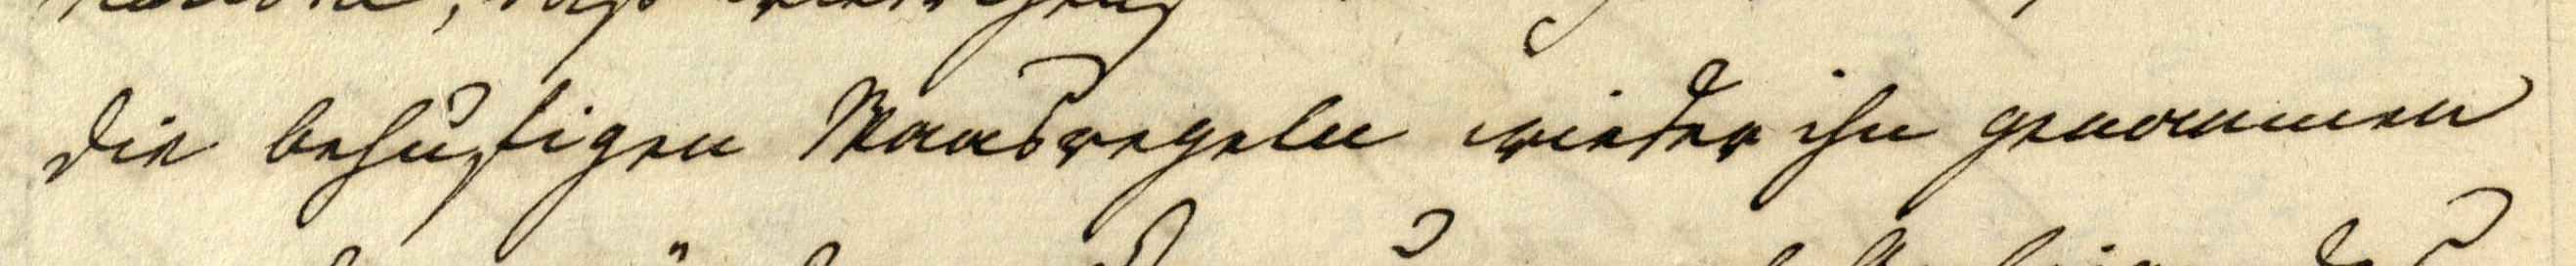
die behufigen Maasregeln wieder ihn genommen
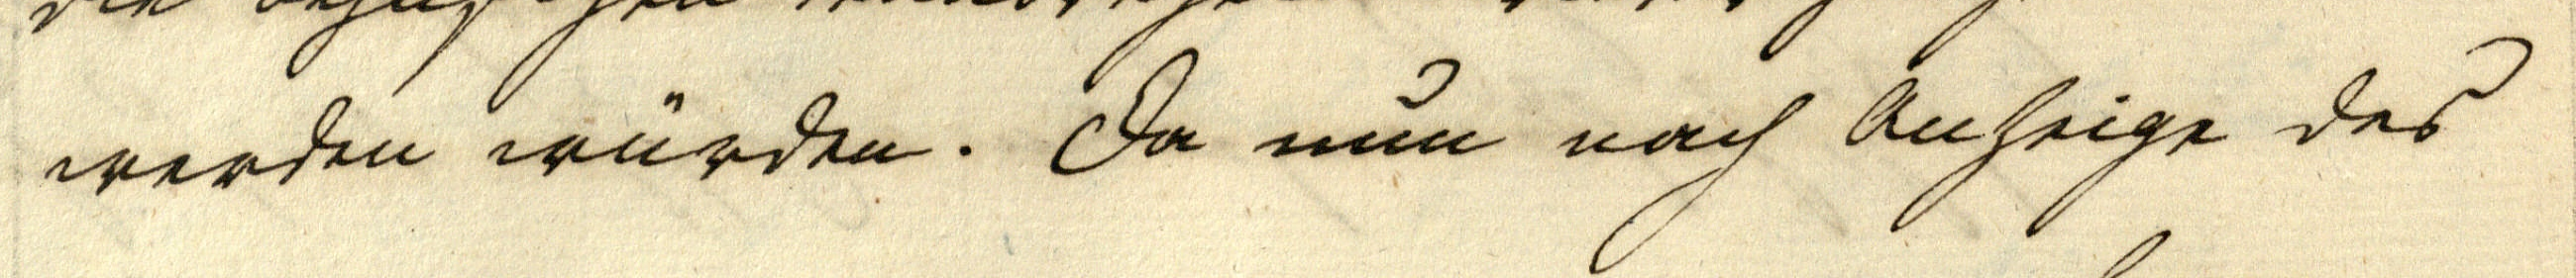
werden würden. Da nun nach Anzeige des
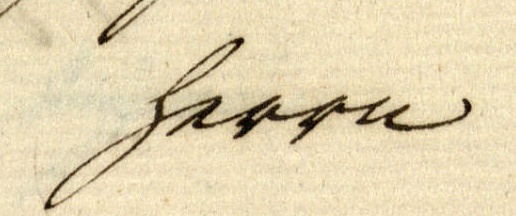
Herrn
